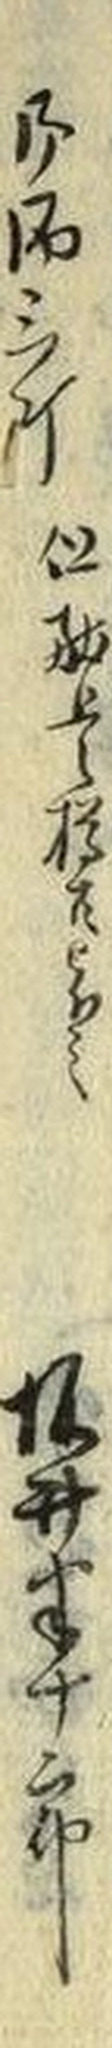御酒三斤但献上之樽共被下之坂井半十郎

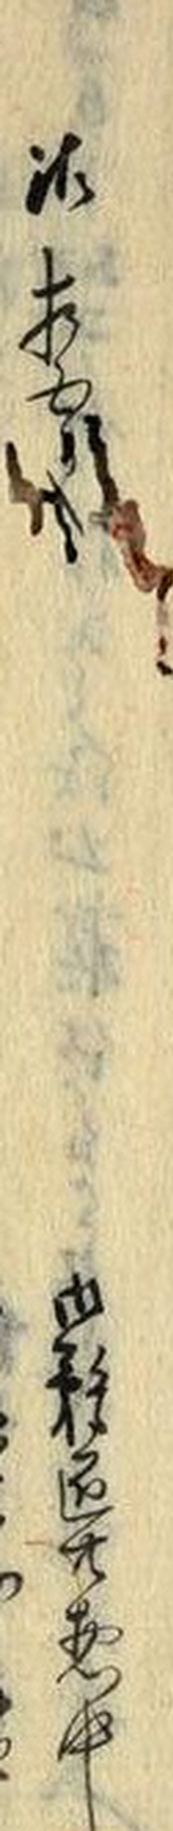銀拾五匁御鵜匠共惣中へ
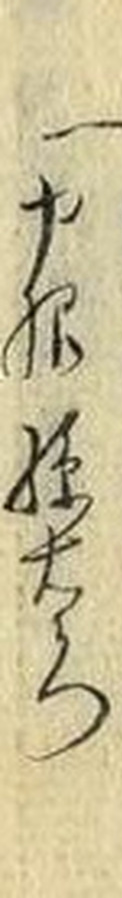中根孫右衛門
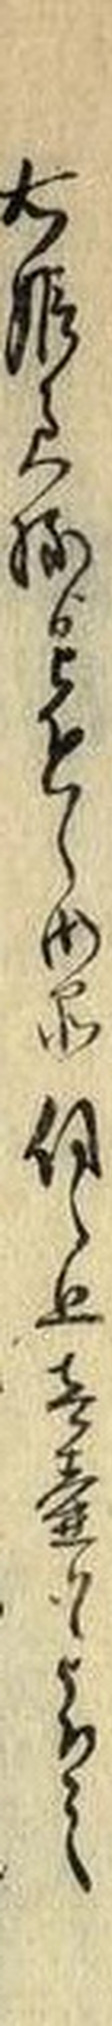右姫君様ゟ被進之御品伺之上壱壺ツヽ被下之
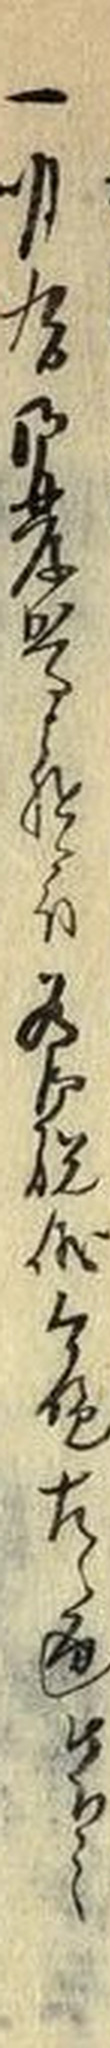一明九日御発駕被遊候ニ付為御祝儀今晩左之通被下之
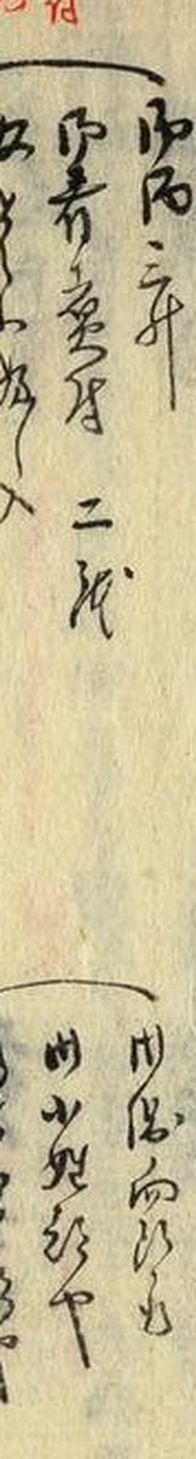御肴煮付二鉢御小姓部や
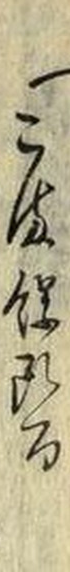こま饅頭百
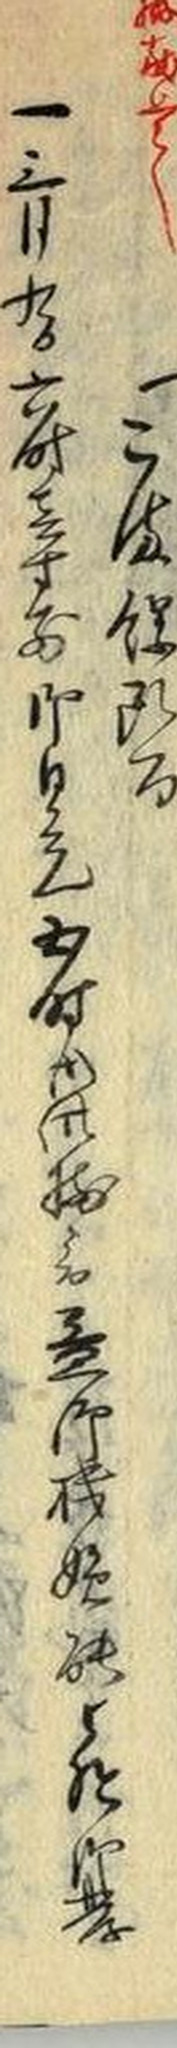一三月九日六時壱寸前御目覚五時御供揃ニ而益御機嫌能被遊御発
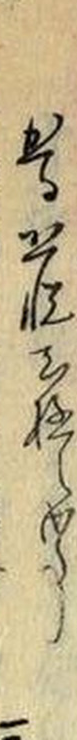駕恐悦至極之御事
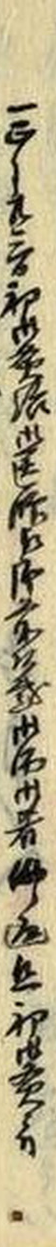一正月廿三日初御灸治御医師江御前頂戴御酒御肴例之通但初御灸ニ付
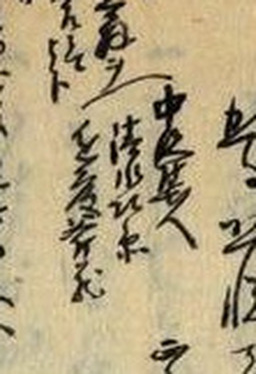清水次兵衛
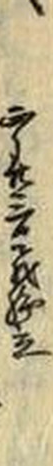正月廿三日飛脚立
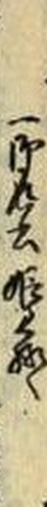一御返書姫君様へ
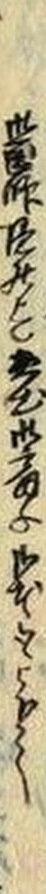御医師隠居迄惣出御扇子弐本ツヽ被下之
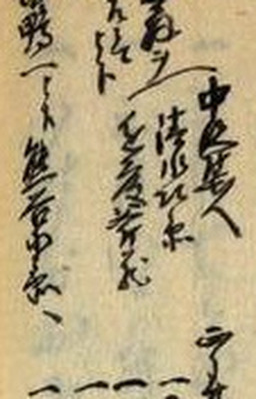近藤斧蔵
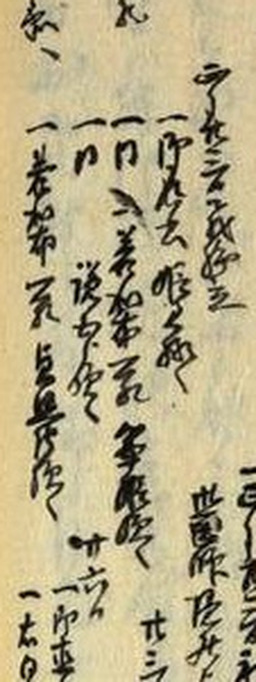一同一若和布一箱箏姫様へ
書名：少傅日録抄（斉承付側向頭取日記、在国）
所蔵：福井県文書館 Fukui Prefectural Archives
